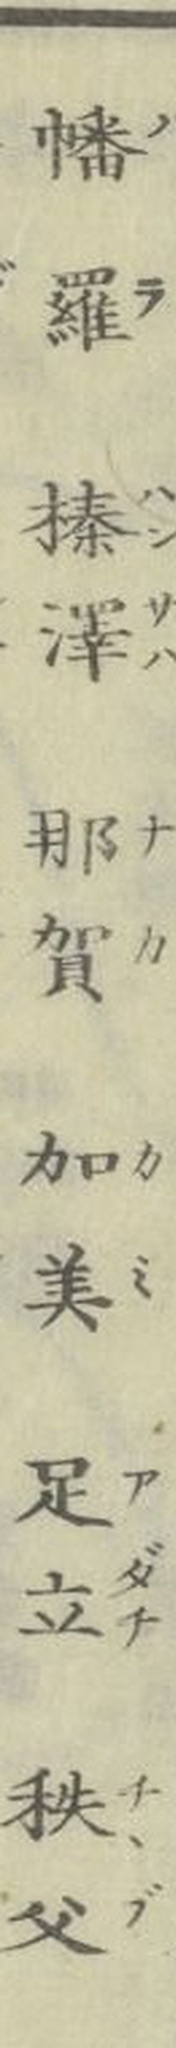幡羅榛澤那賀加美足立秩父
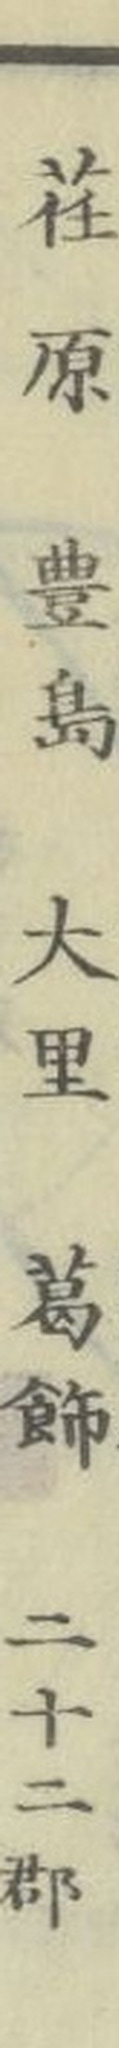荏原豊島大里葛飾二十二郡
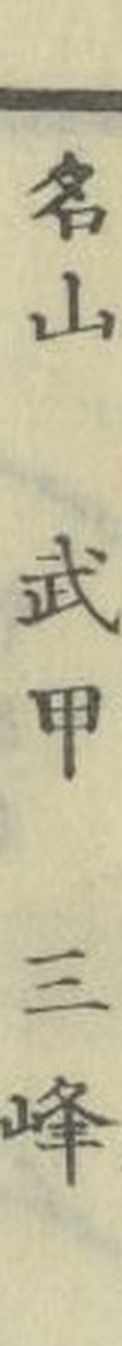名山武甲三峰
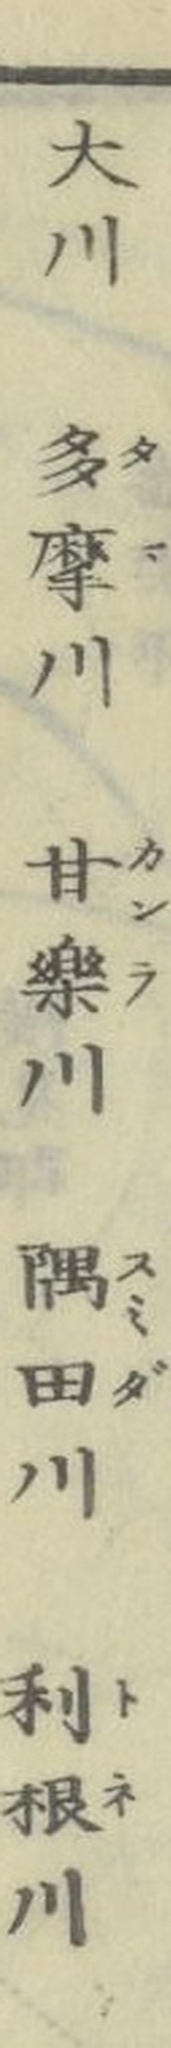大川多摩川甘樂川隅田川利根川
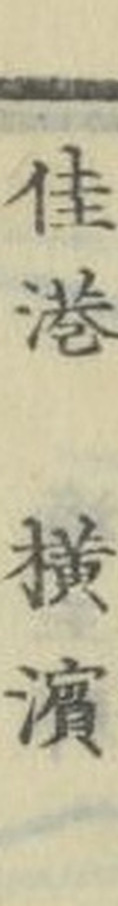佳港横濵
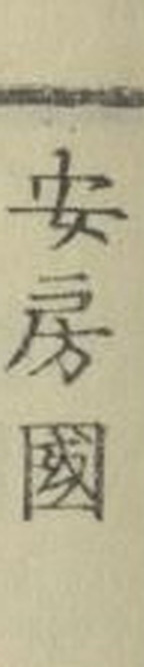安房國
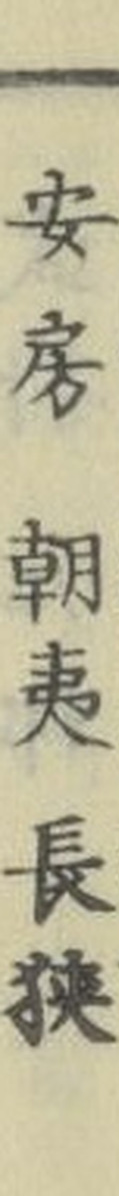安房朝夷長狭
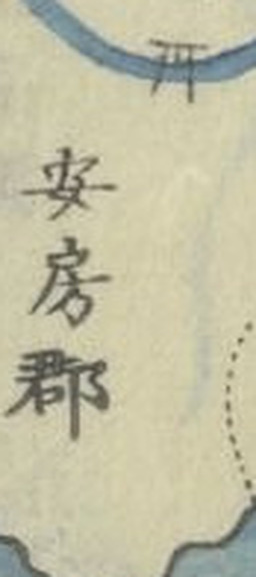安房國
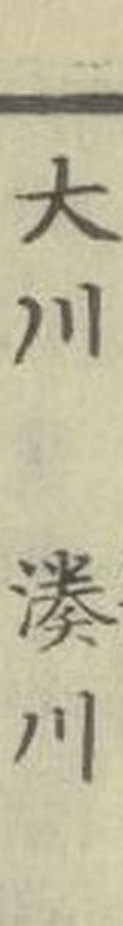大川湊川
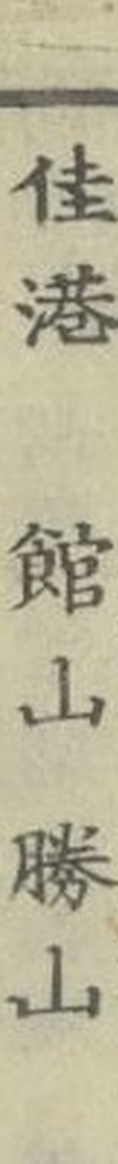佳港館山勝山

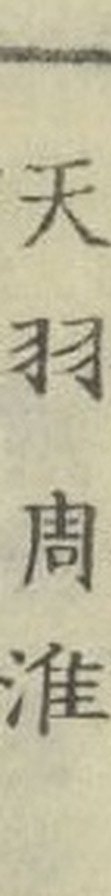天羽周淮
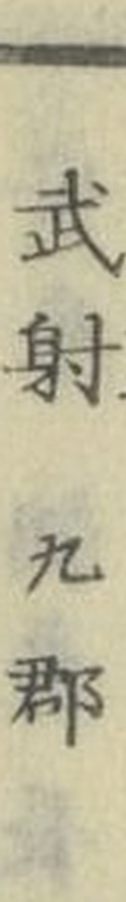武射九郡
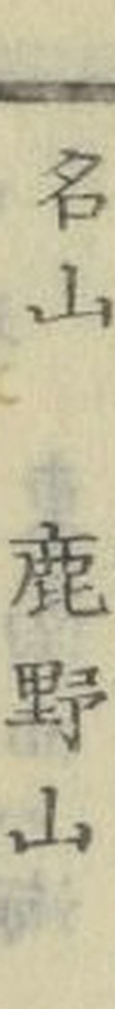名山鹿野山
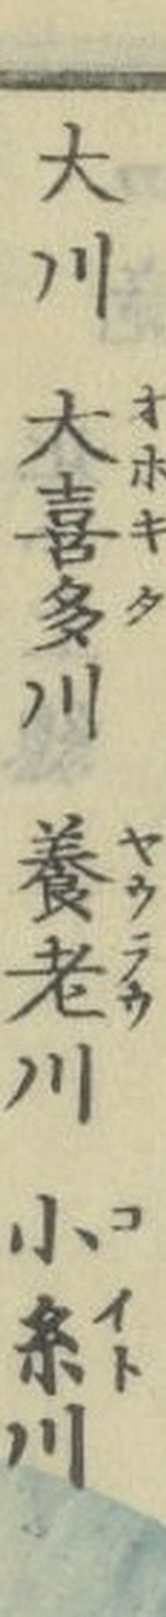大川大喜多川養老川小糸川
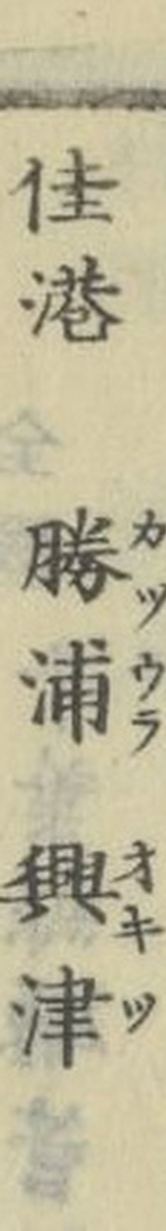佳港勝浦興津
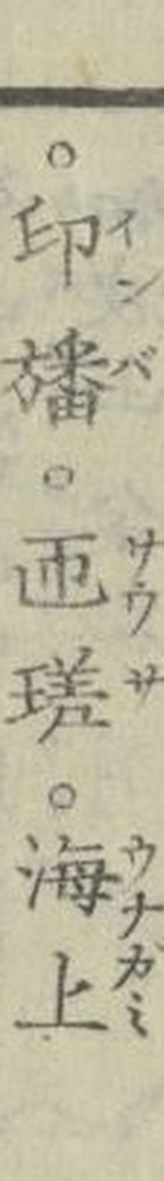○印旙○匝瑳○海上
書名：下等小学日本地誌略図問答 巻上 畿内東海道之部
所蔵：University of the Ryukyus Library
